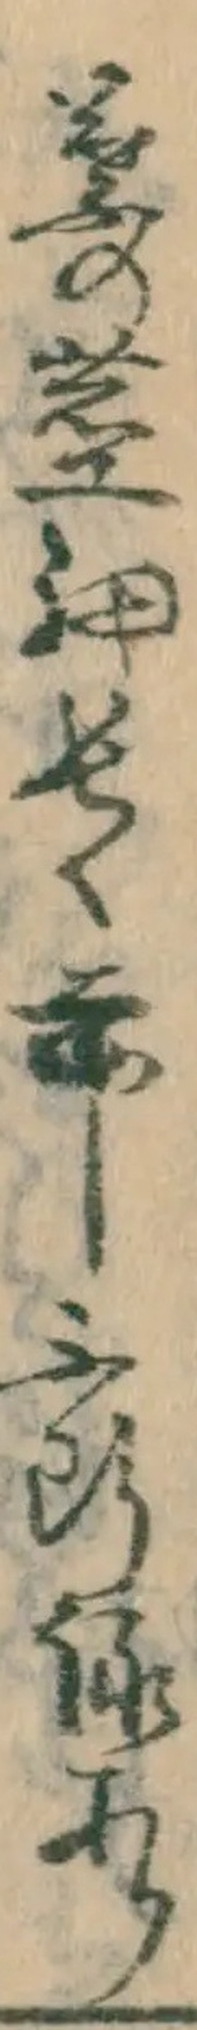葉の茎細長く赤し不断詠あり
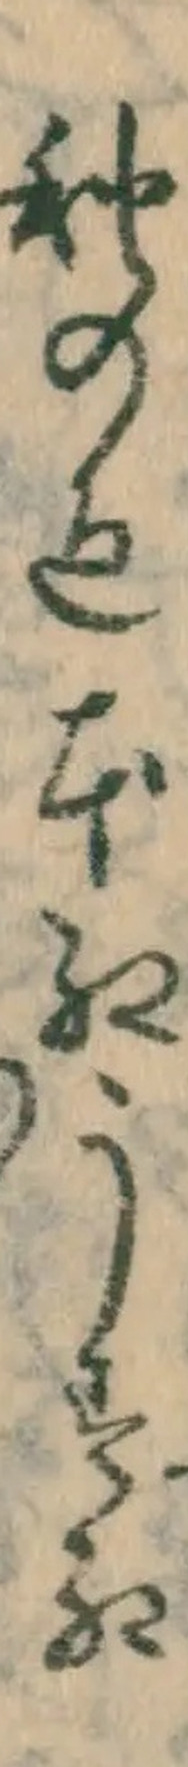秋の色本紅うす紅
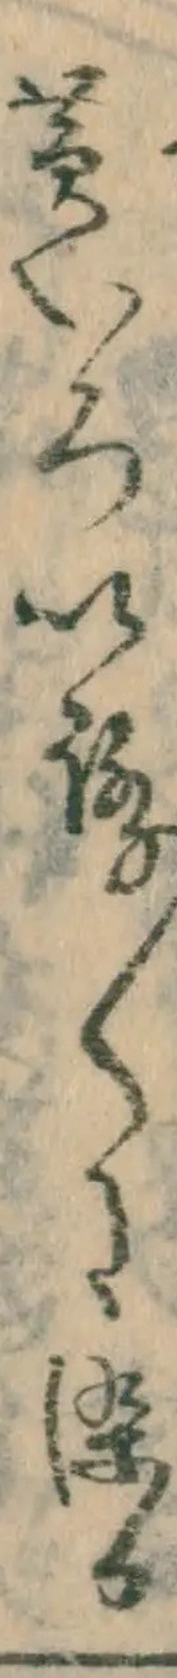黄いろいろ〳〵に染る
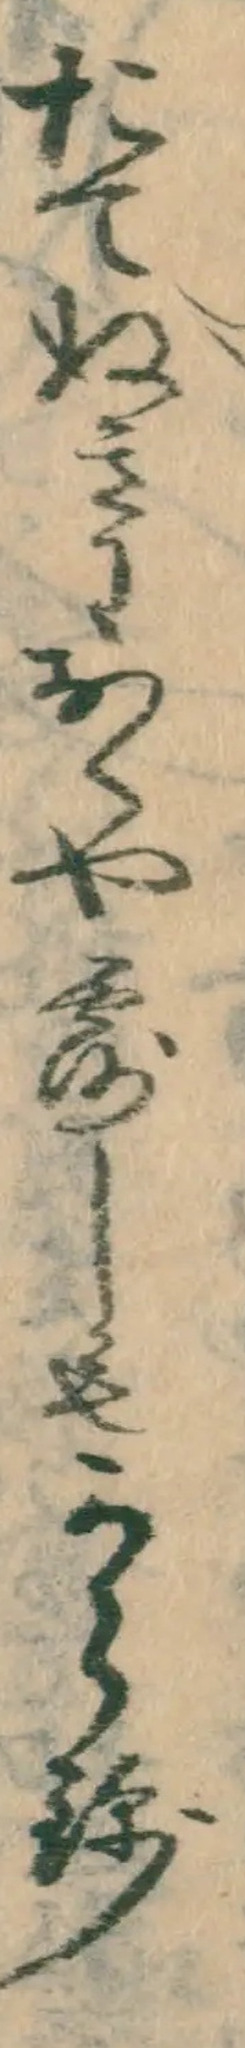たてぬきにおくや露しもから錦
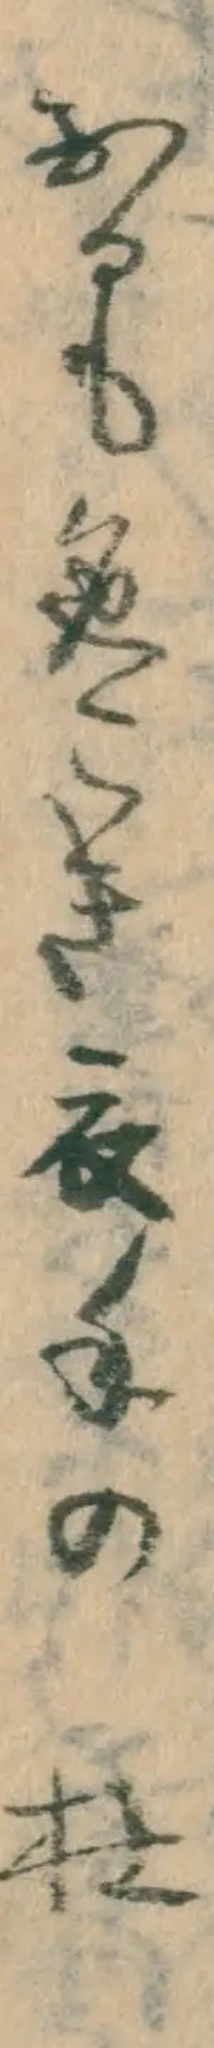おるも色こき衣手の杜

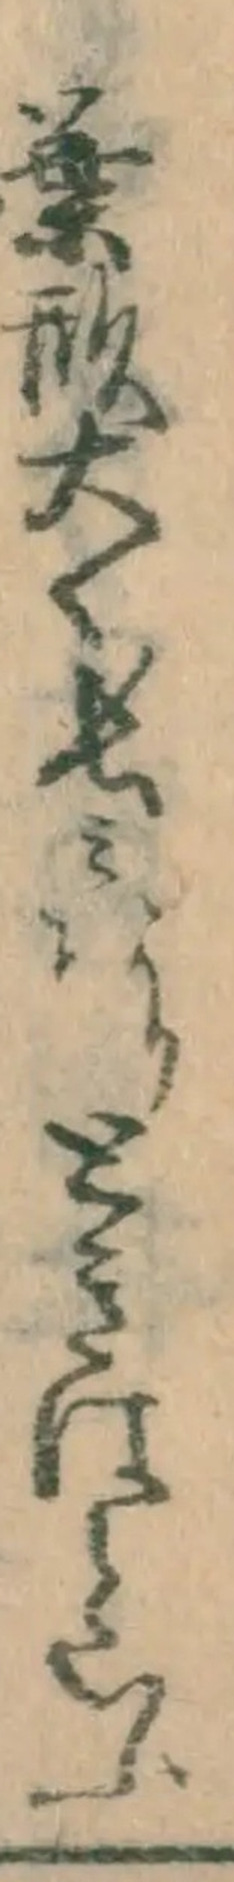柞葉形大く長みありときはといふ
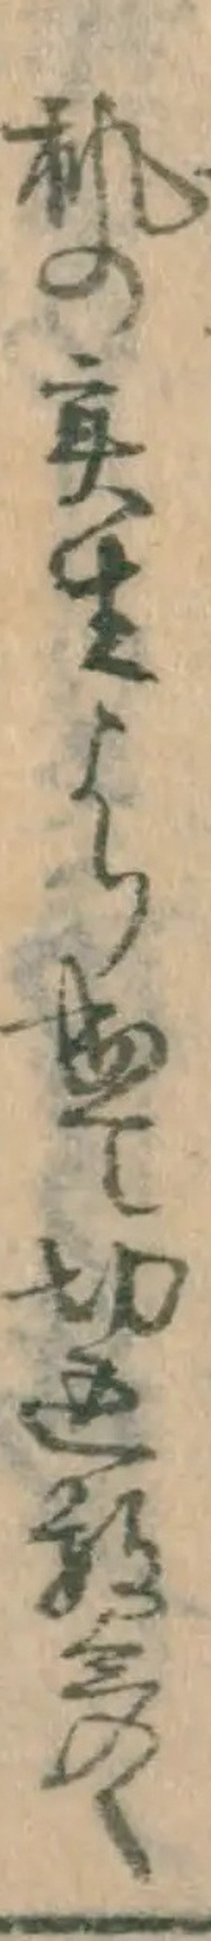楓の実生より出て切込数多く
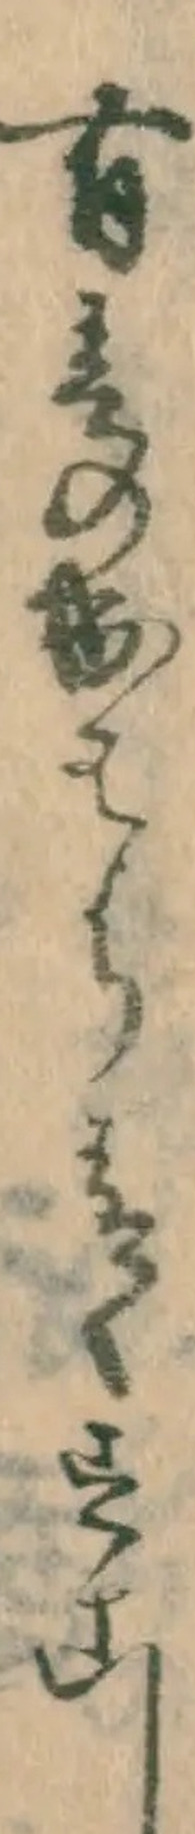有春の出はより青くすこし
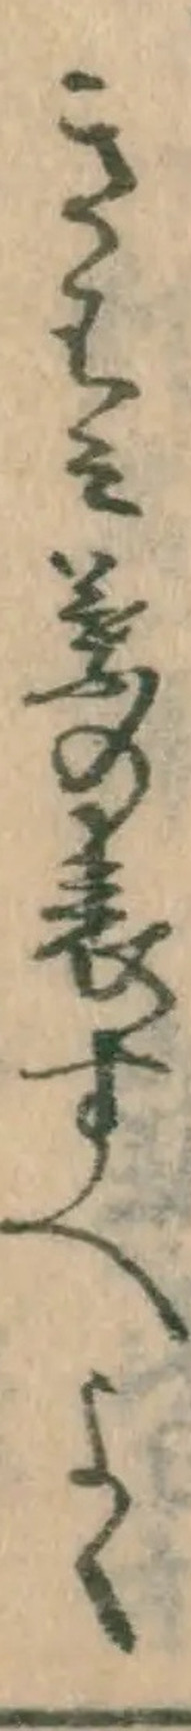きはみ葉の表すへよく
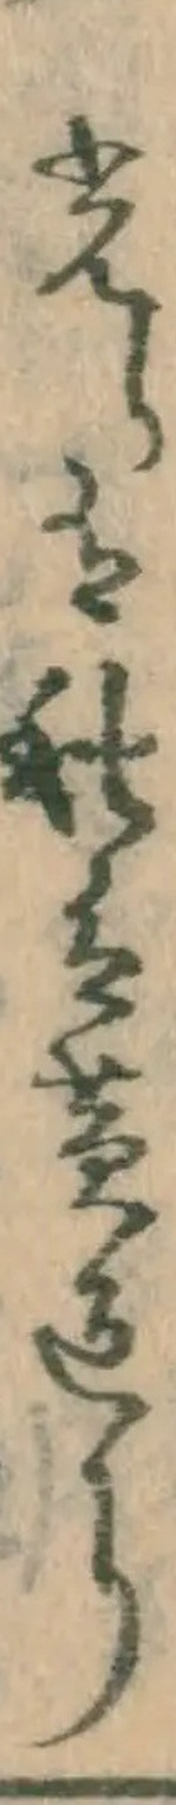光り有秋は黄色に
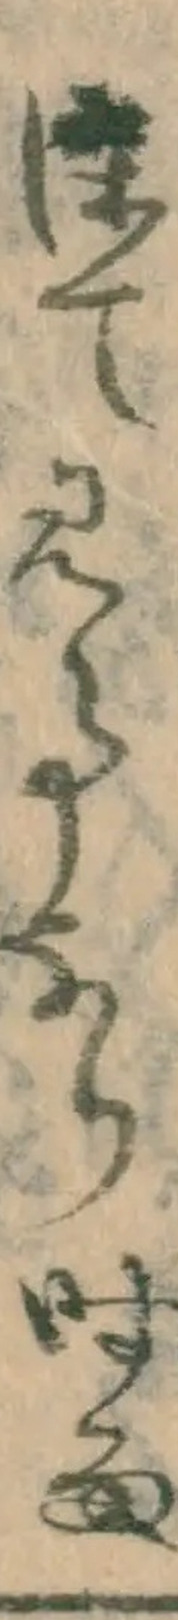染て見事なり時雨
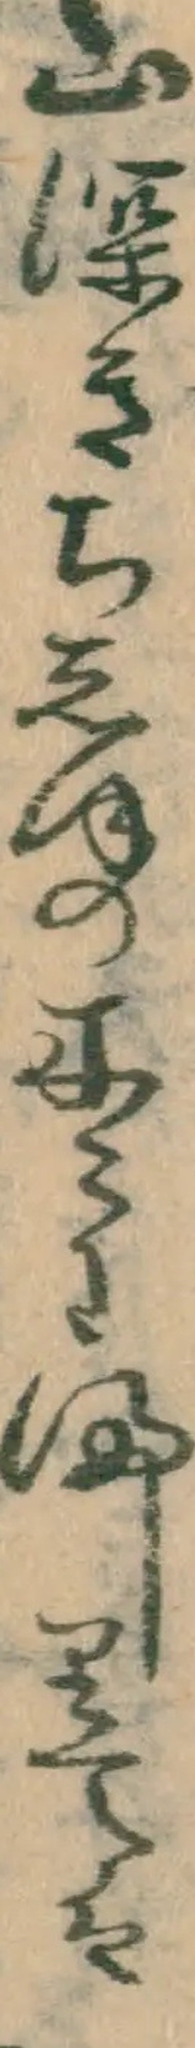山深きちしほの木々にましりては
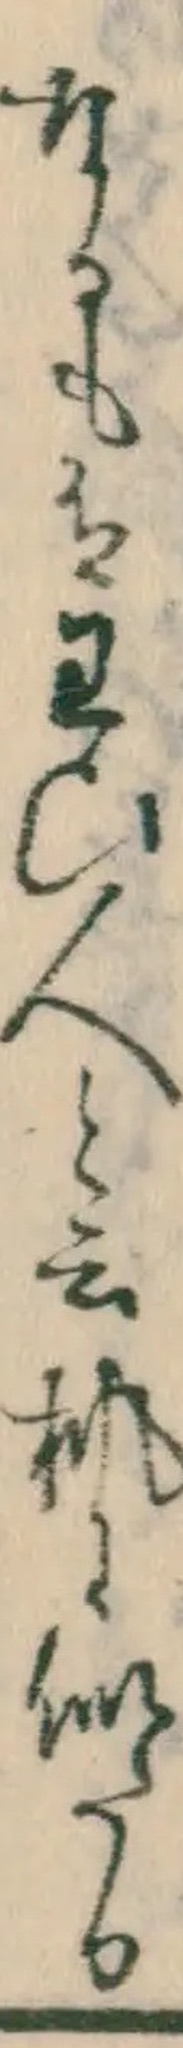なるも有わひ人と云楓に似たる
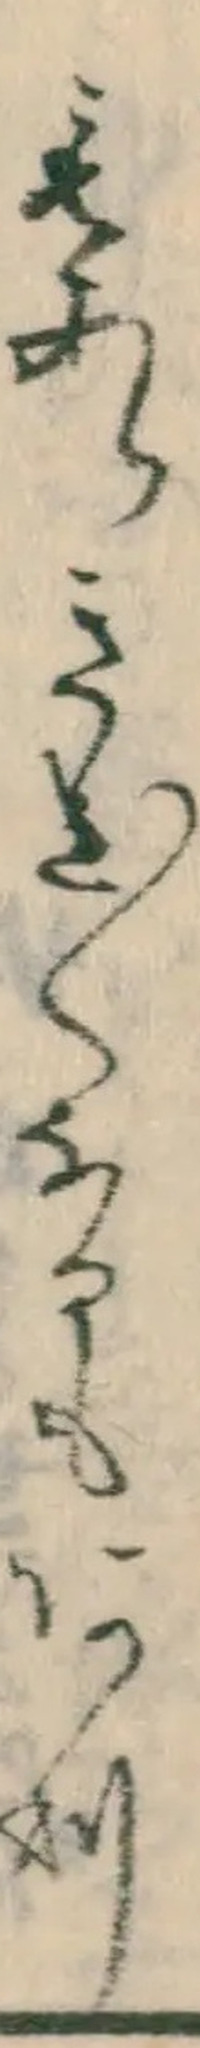もありきれ〳〵なるもあり
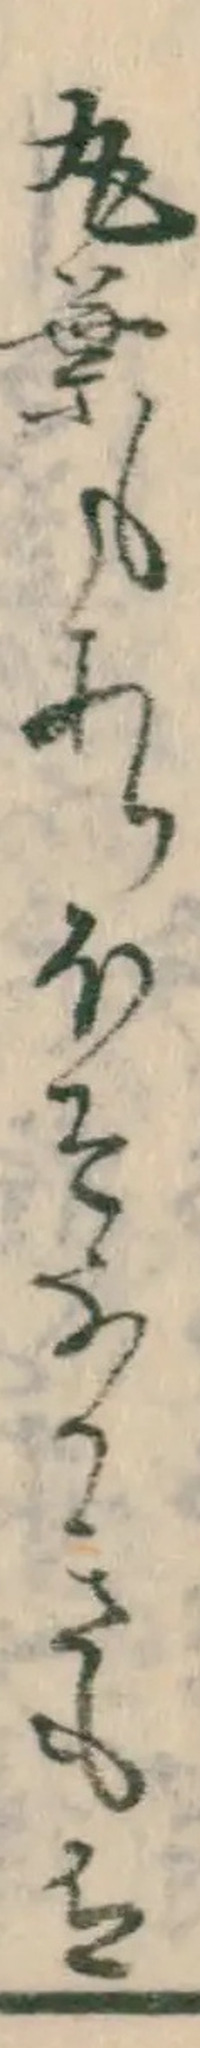丸葉もありほそなかきも有
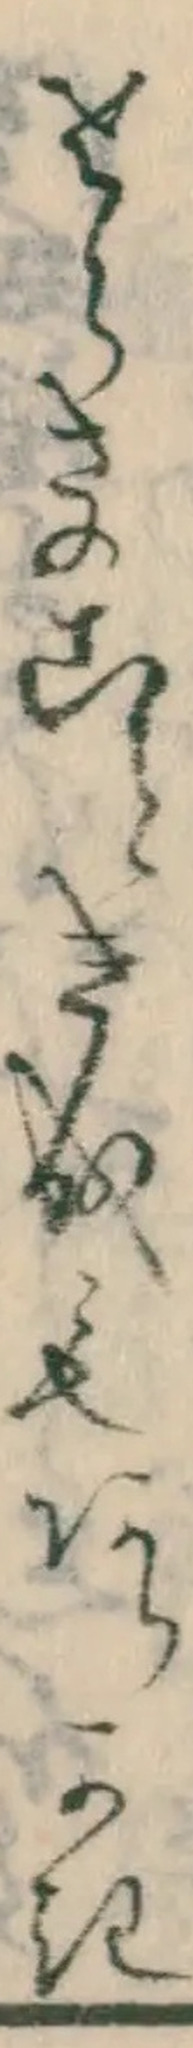さらさのことき成もありかき
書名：紅葉集
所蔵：国立国会図書館 National Diet Library, JAPAN
